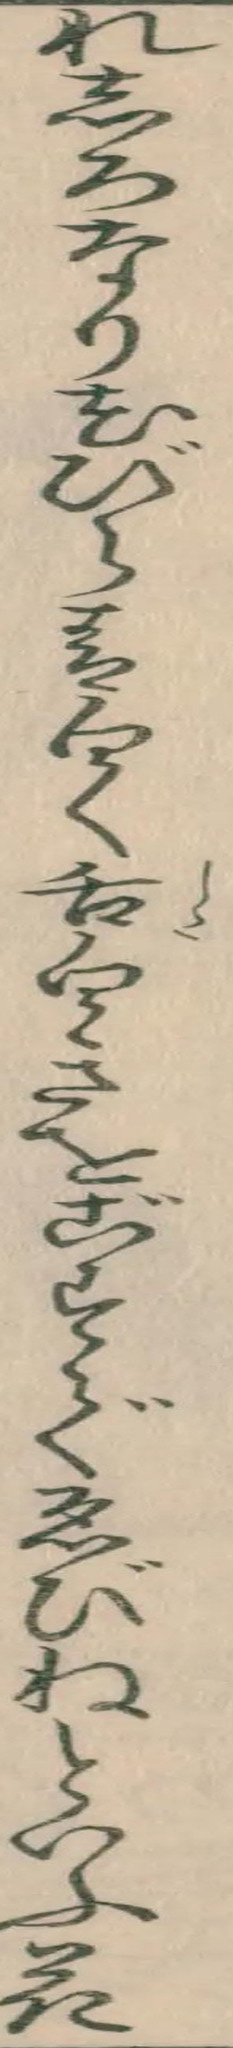れしろなり花びら青白く舌白きをごすでゑびねといふ花
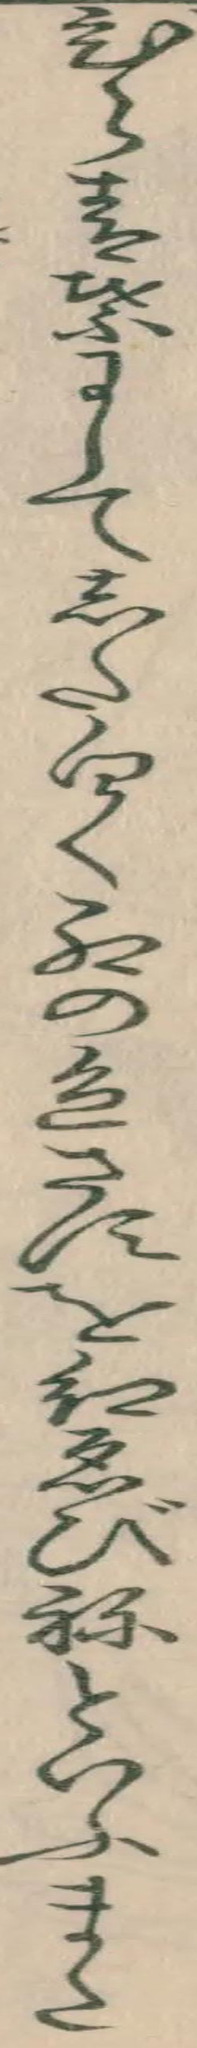びら青葉にしてした白く紅の色さすを紅ゑびねといふまた
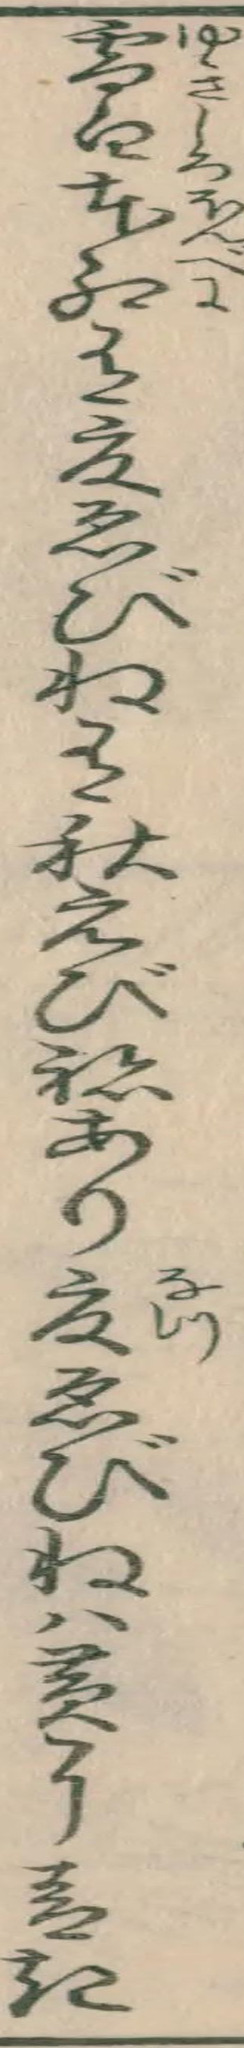雪白本紅有夏ゑびね有秋えびねあり夏ゑびねは黄に青き
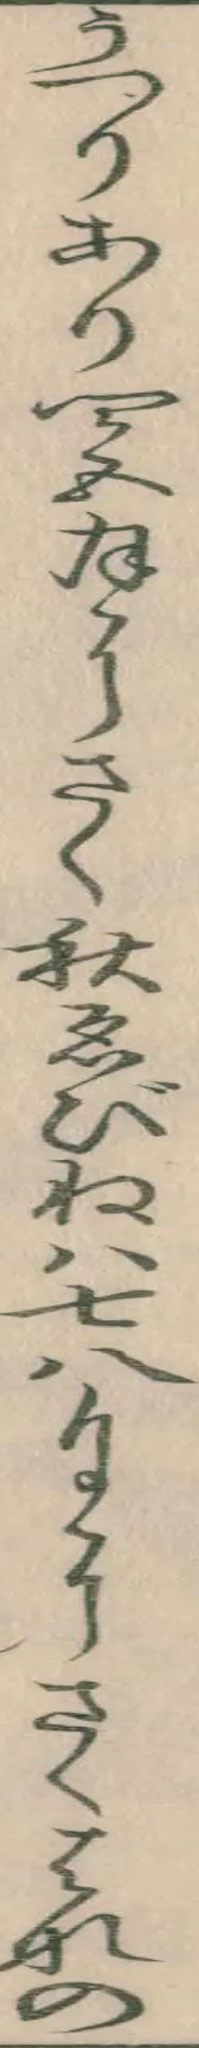うつりあり四五月にさく秋ゑびねは七八月にさくはなの
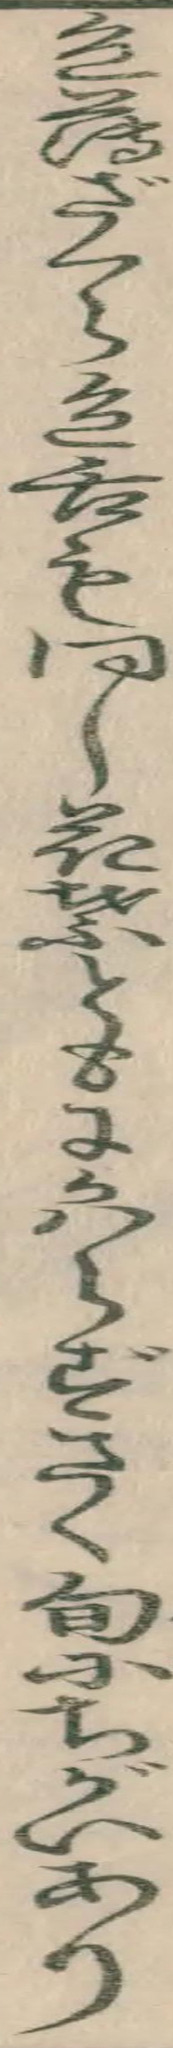色薄ざくら色舌も同し花葉ともにかはらずさく旬にちがいあり
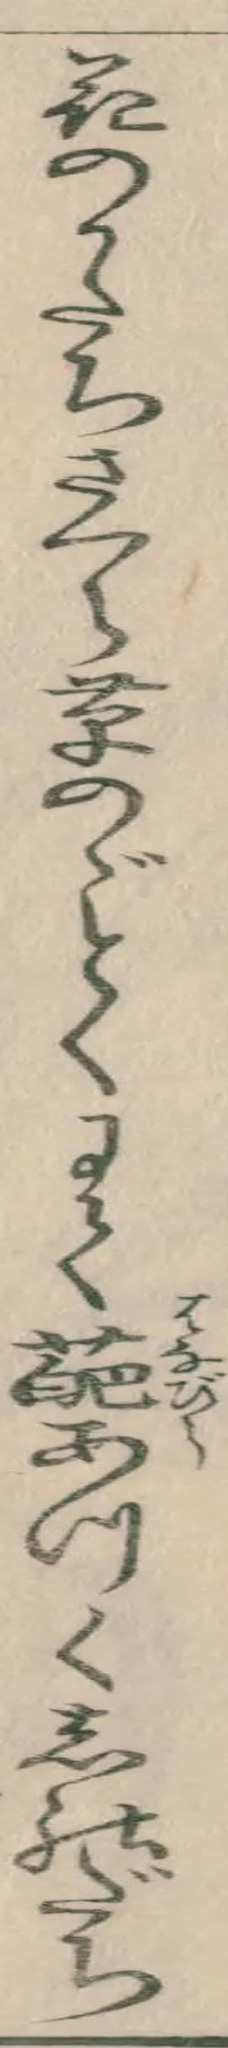花のかたちさくら草のごとくにて葩あつくしのだち
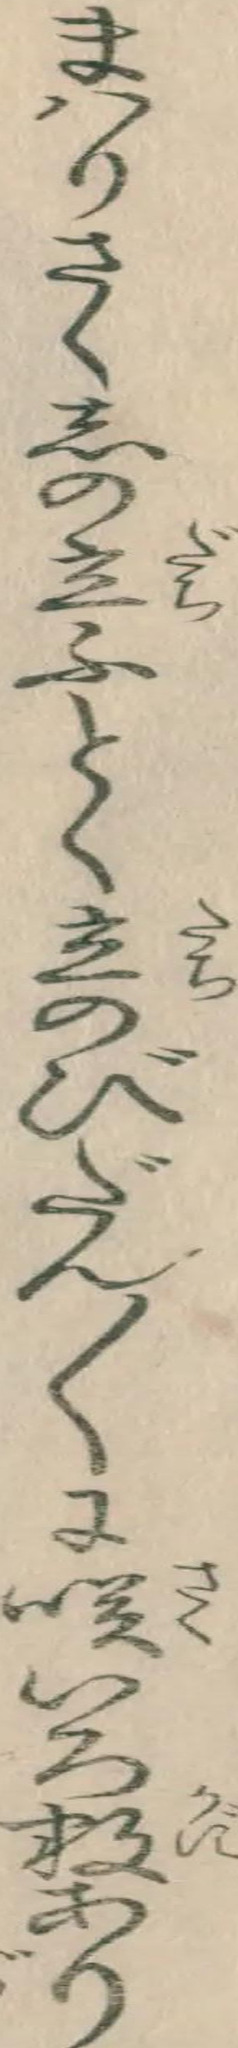まはりさくしの立ふとく立のびだん〳〵に咲いろ数あり
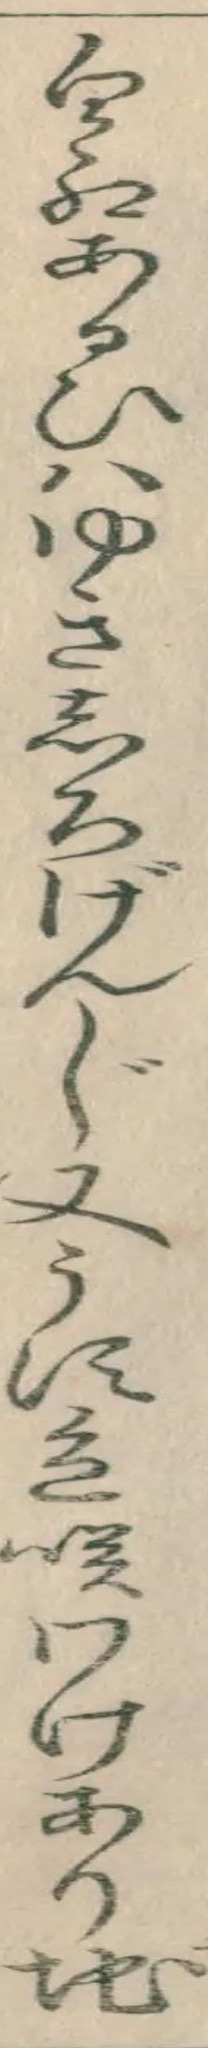白紅あるひはゆきしろげんじ又うす色咲わけあり地
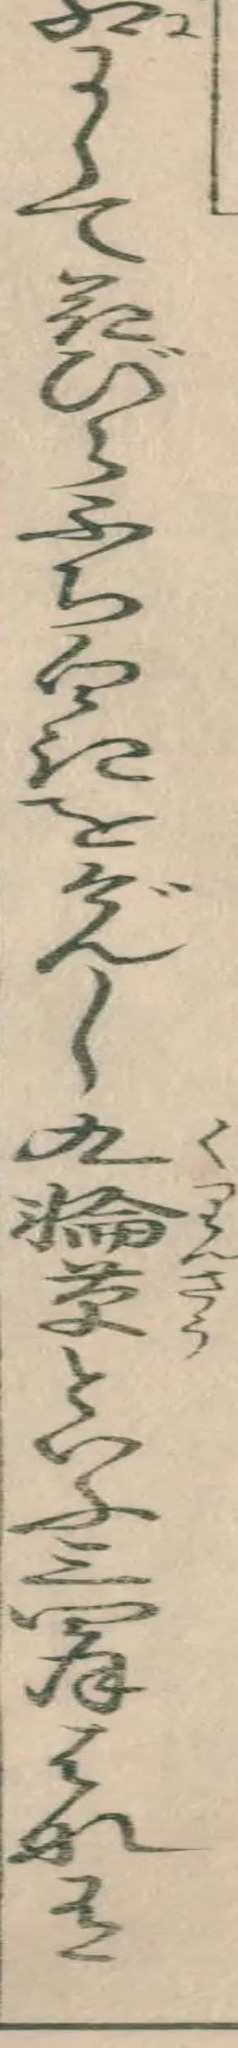紅にして花びらふち白きをげんし九輪草といふ三四月はな有
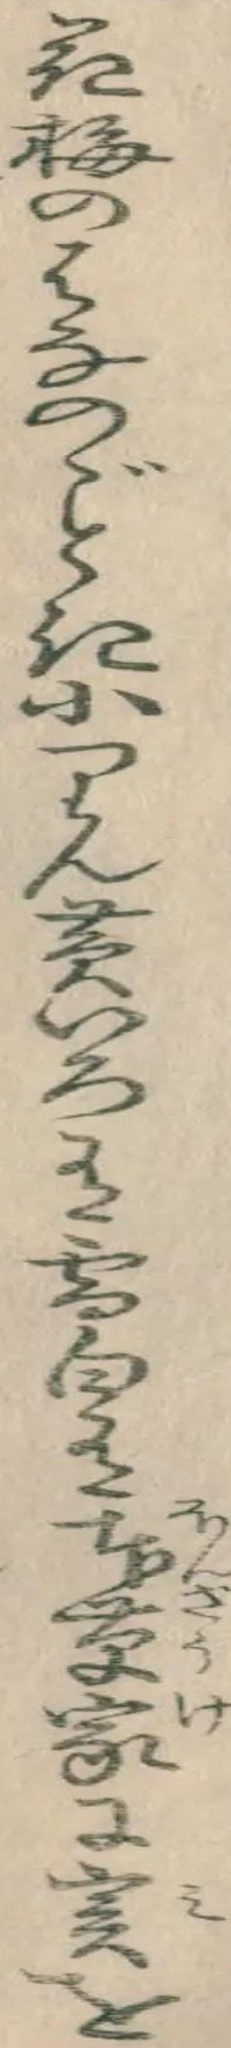花梅のはなのごとき小りん黄いろ有雪白有本草家に実を

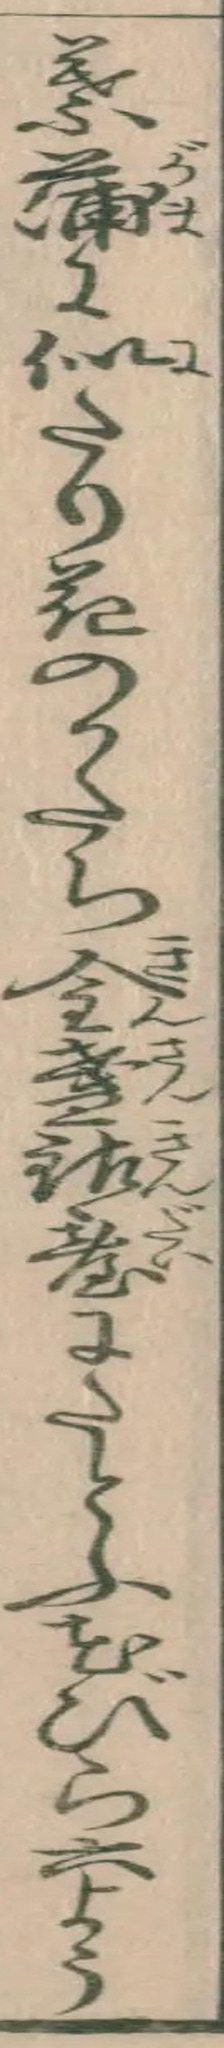葉蒲に似たり花のかたち金盞銀台にたとふ花びら六よう
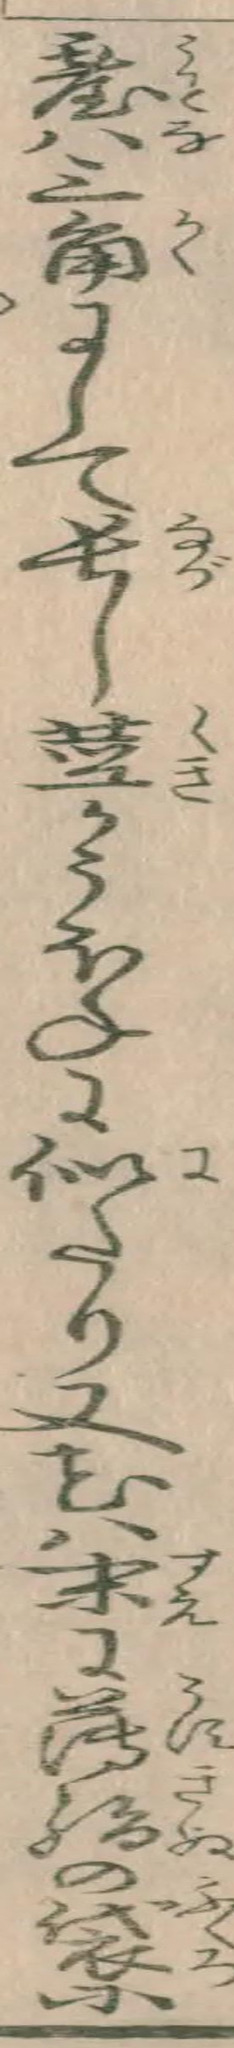台は三角にして長し茎かうほねに似たり又花は末に薄絹の袋に
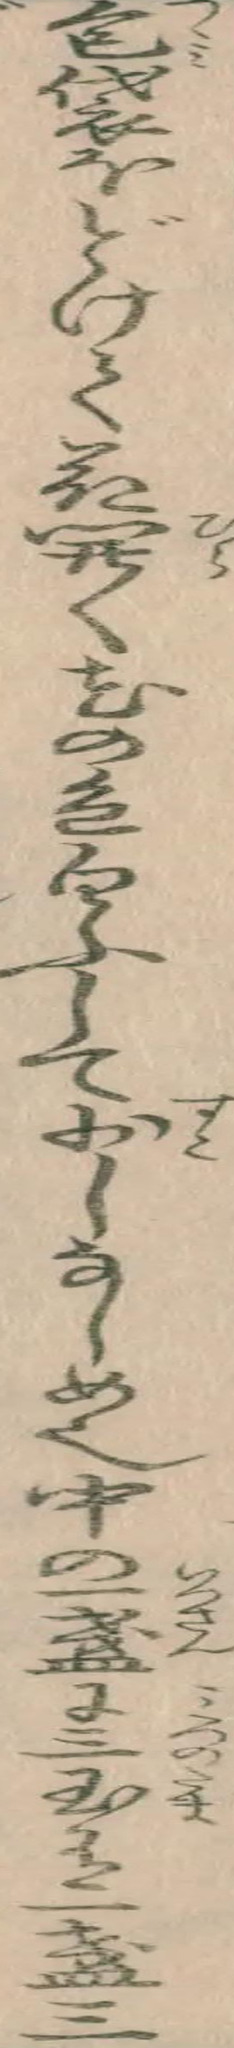包袋ほどけて花開く花の色白ふして少しなしめ也中の一盞に三玉有一盞三
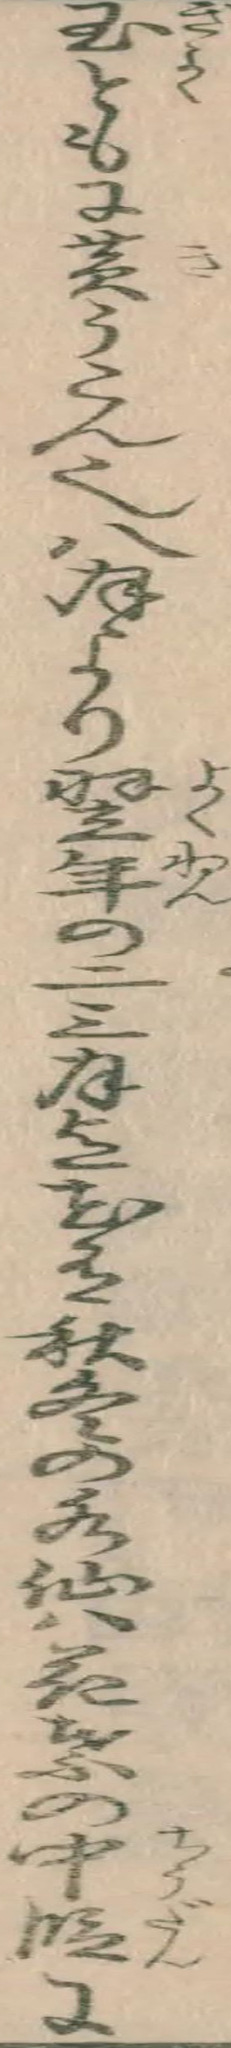玉ともに黄うこん也八月より翌年の二三月迄花有秋冬の水仙は花葉の中段に
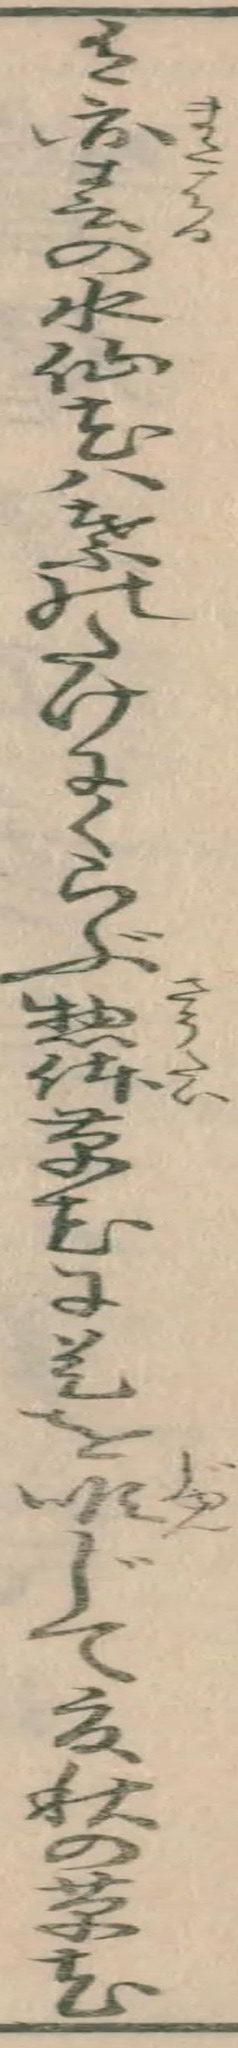有亦春の水仙花は葉のたけにくらぶ総体草花に是を順じて夏秋の草花
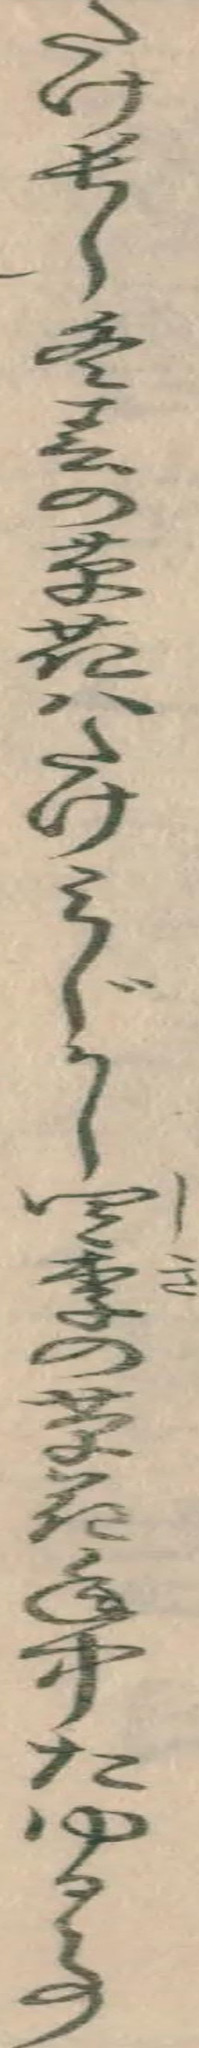たけ長し冬春の草花はたけみじかし四季の草花年中たゆる事
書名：畫本野山草. [5]
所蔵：国立国会図書館 National Diet Library, JAPAN
